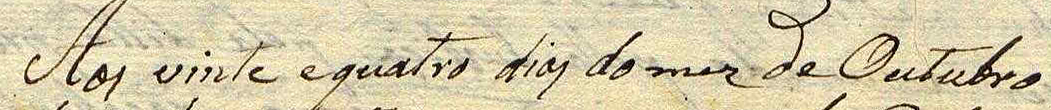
Aos vinte e quatro dias do mez de Outubro
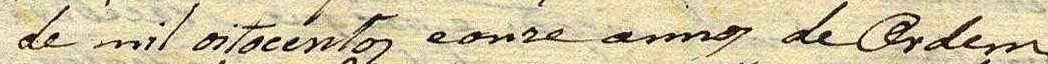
de mil oitocentos e onze annos de Ordem
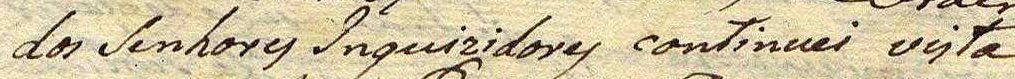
dos Senhores Inquizidores continuei vista
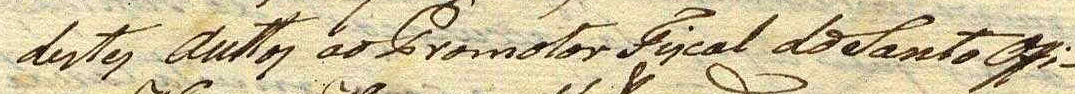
destes Auttos ao Promotor Fiscal do Santo Offi
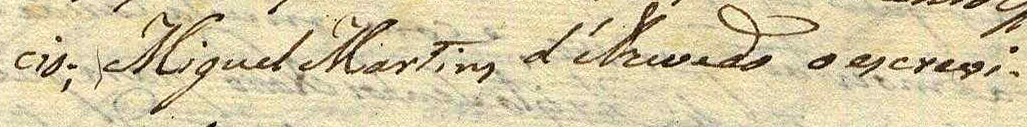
cio; Miguel Martins d'Azevedo o escrevi.
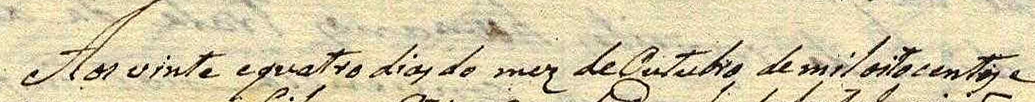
Aos vinte e quatro dias do mez de Outubro de mil oitocentos e
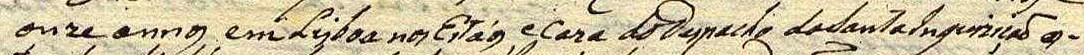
onze annos, em Lisboa nos Estáos, e caza do Despacho da Santa Inquiziçaõ es
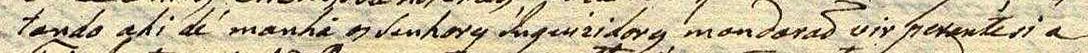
tando ahi de manhã os Senhores Inquizidores, mandaraõ vir perante si a
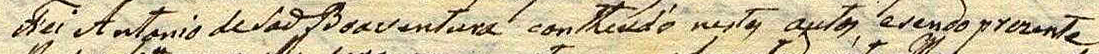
Frei Antonio de Saõ Boaventura contheudo nestes autos, e sendo prezente
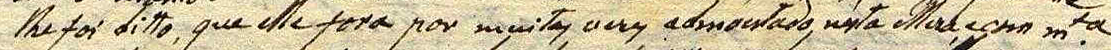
lhe foi ditto, que elle fora por muitas uezes admoestado, nesta Meza e com m.ta
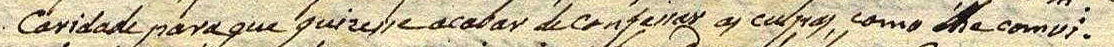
Caridade para que quizesse acabar de confessar as culpas, como lhe comvi
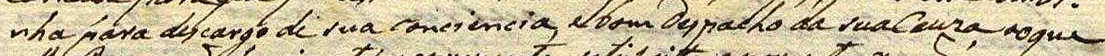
nha para descargo de sua conciencia, e bom despacho da sua cauza ao que
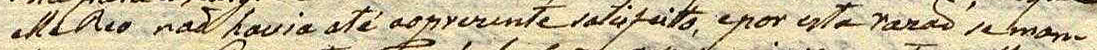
elle Reo naõ havia até ao prezente satisfeito, e por esta razaõ se man
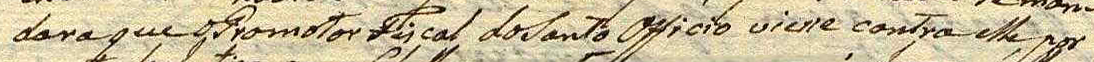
dara que o Promotor Fiscal do Santo Officio viesse contra elle, por
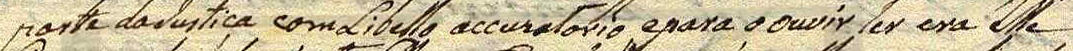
parte da Iustiça com Libello accuzatorio, e para o ouvir ler era elle
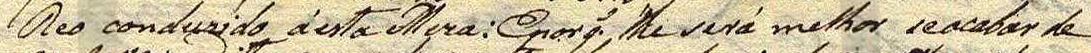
Reo conduzido á esta Meza: E porq̄ lhe será melhor se acabar de
